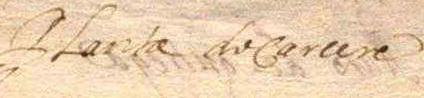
Planta do Carcere
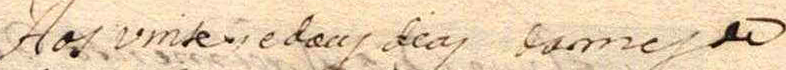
Aos vinte e dous dias do mes de
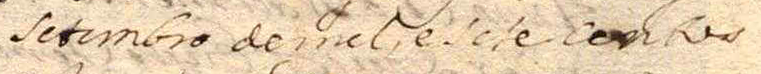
setembro de mil e setecentos
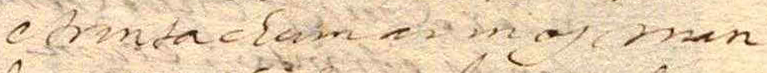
e trinta e hum annos man
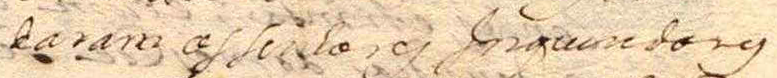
daram os senhores Jnquisidores
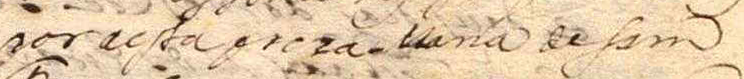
por a esta preza Maria de sam
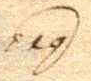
e a q̄
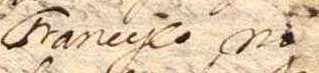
Francisco no
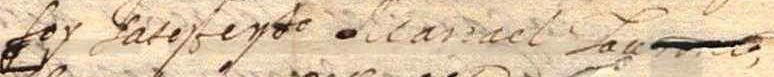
foy satesfeyto Manoel Lou_
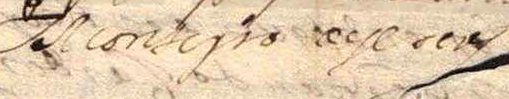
Monteyro o escrevj
